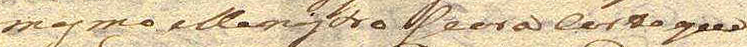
mesmo Menistro se era certo que
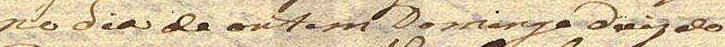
no dia de ontem Domingo duis do
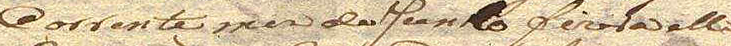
corrente memz de Junho fizeraelle
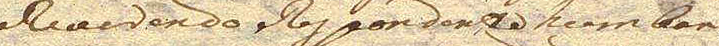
Reverendo Respondente hum ban
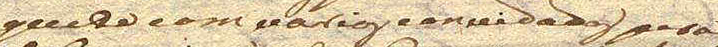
quete com varios convidados para
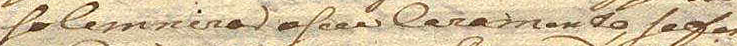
solemnizar o seu Cazamento, se foi
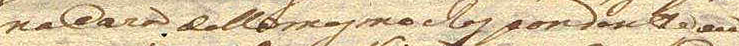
na caza delle mesmo Respondente ou
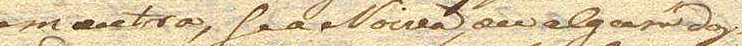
em outra, se a Noiva, ou algum dos
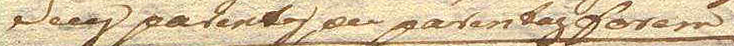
seus parentes, ou parentas foram
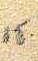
15
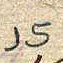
15
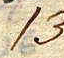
13
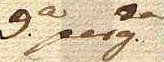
9.a perg.ta
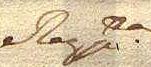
Resp.ta
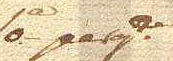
10.a perg.ta
